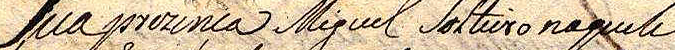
Sua prezença Miguel Solteiro naquele
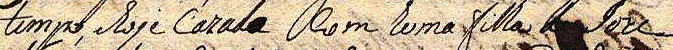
tempo, e hoje cazada com huma filha d_ Ioze
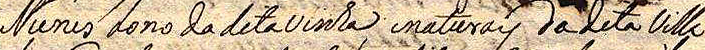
Nunes dono da dita vinha, e naturais da dita Villa
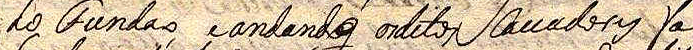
do Fundao, e andando os ditos Cauadores fa
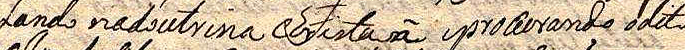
lando na doutrina christaã, e procurando o dito
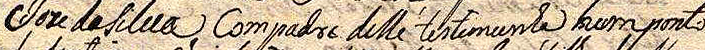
Ioze da silua Compadre delle testemunha hum ponto
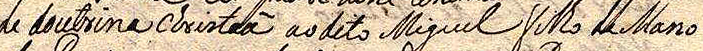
de doutrina christaã ao dito Miguel filho de Mano
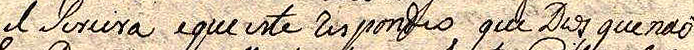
el Pereira e que este Respondeo que Deos que naõ
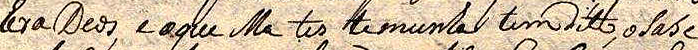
hera Deos, e o que ella testemunha tem dito, o sabe
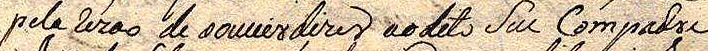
pela rezao de o ouuir dizer ao dito seu Compadre
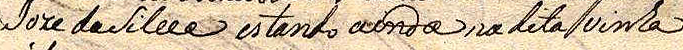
Ioze da Silua estando ainda na dita vinha
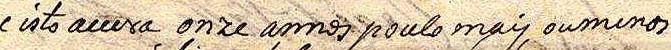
e isto auera onze annos pouco mais, ou menos
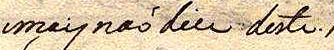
e mais naõ dice deste.
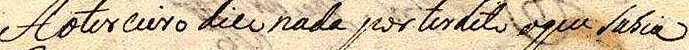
Ao terceiro dice nada por ter dito o que sabia
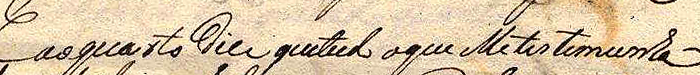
E ao quarto dice que tudo o que elle testemunha
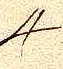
4
